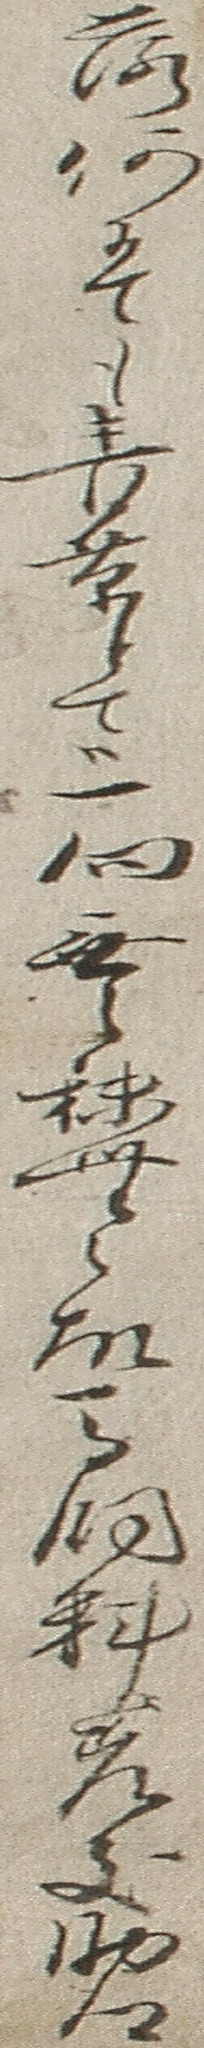落何にても青草とては一向無之秣無之故馬飼料に差支助郷

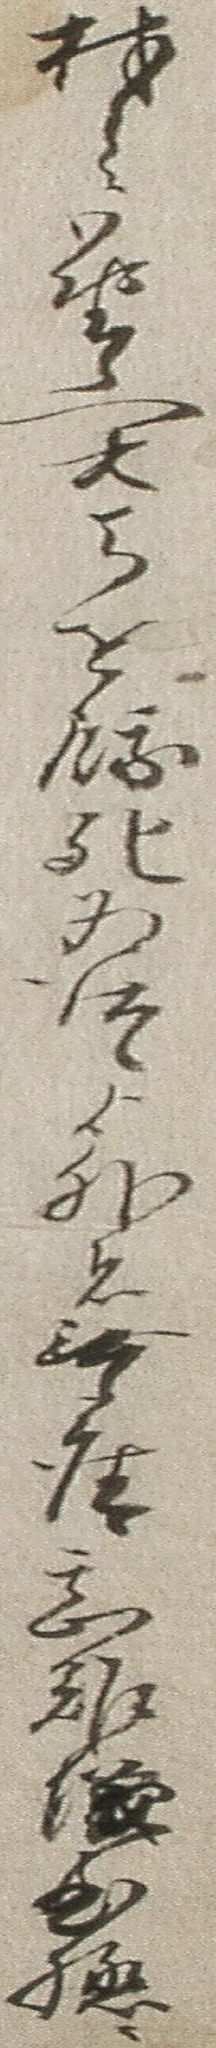村に御座候へ共馬を餓死為仕候ゟ外者無御座候甚難儀至極に
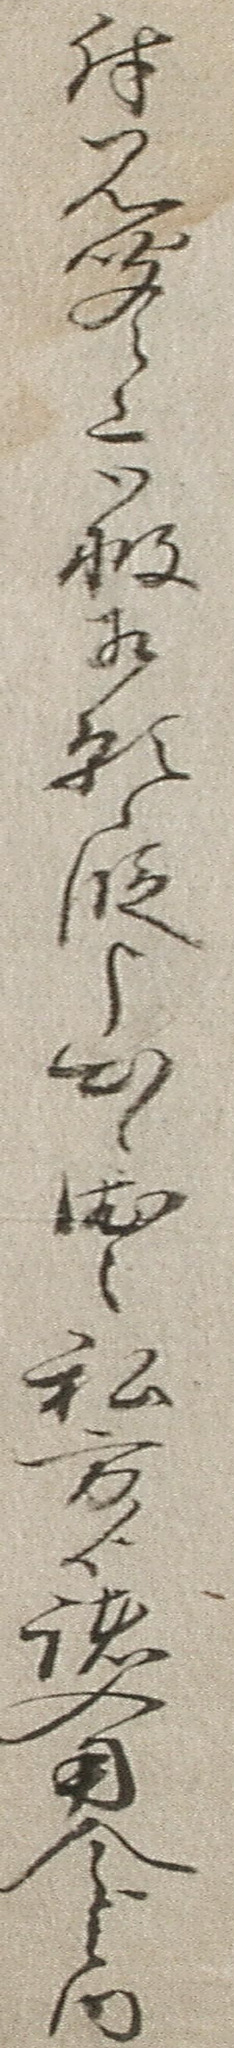付見聞之上御救相願候段申出候依之私方ゟ諸入用金之内
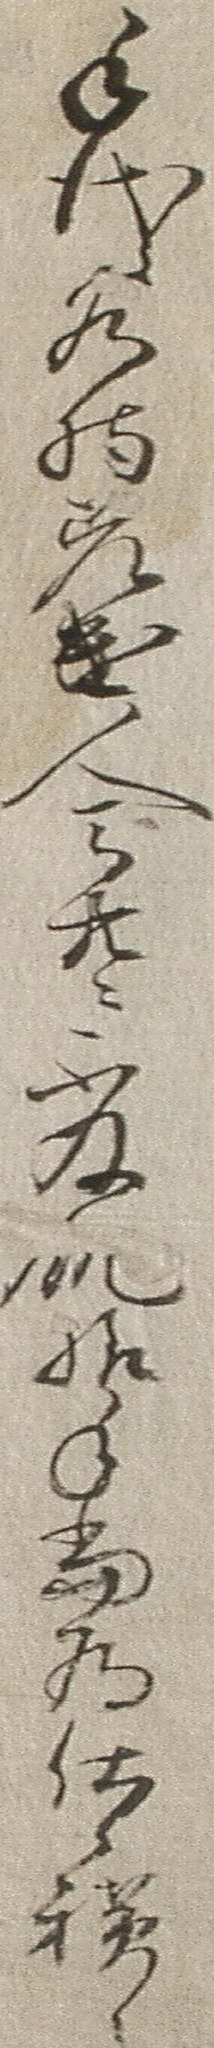手代ニ為持差遣人馬共に不及死？様手当為仕候積に
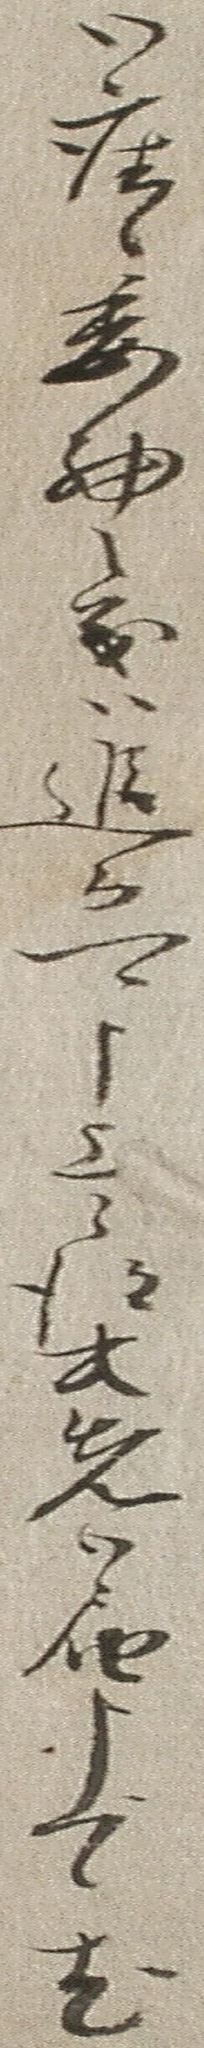御座候委細之義は追而可申上候得共先御届申上候尤
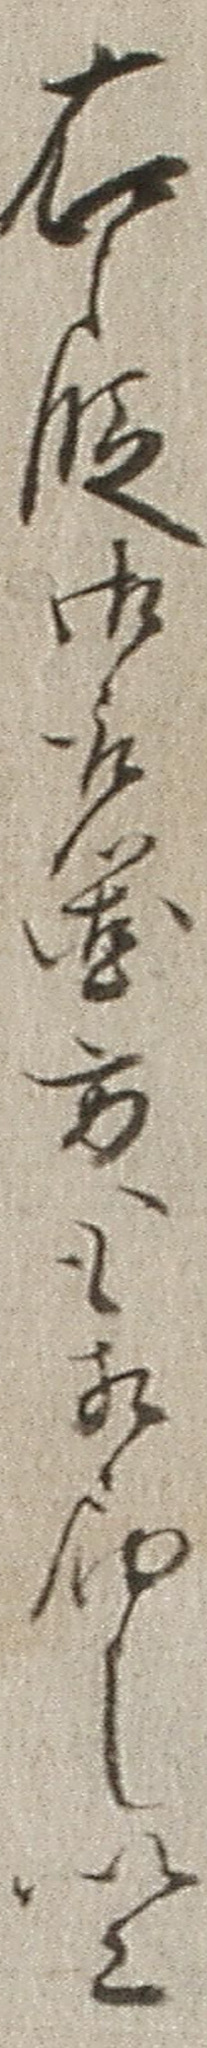右之段御取箇方へも相届申候以上
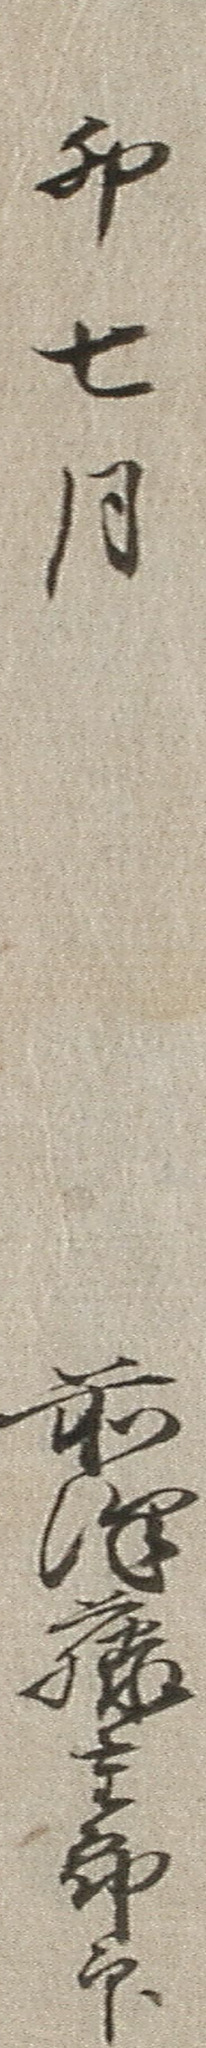卯七月前沢藤重郎印
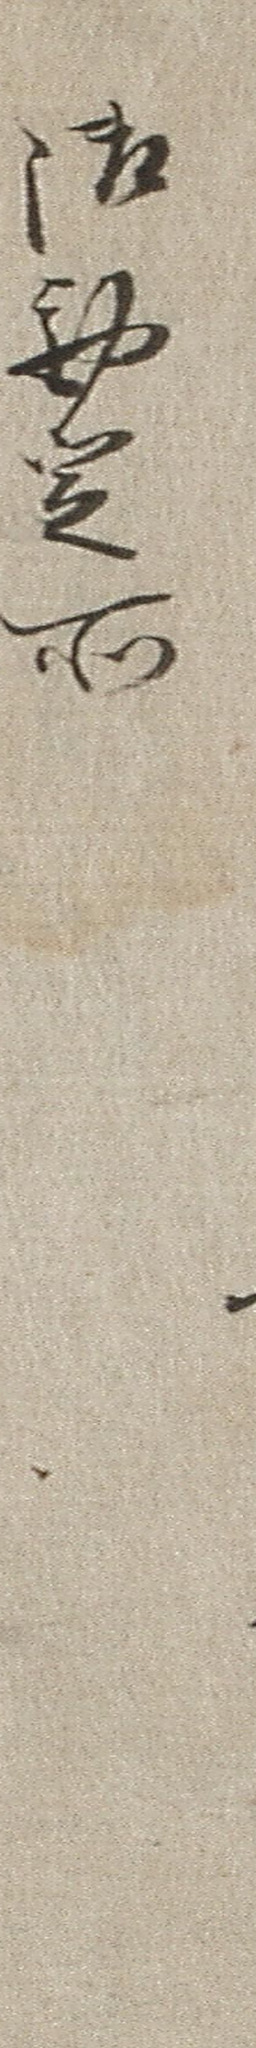御勘定所
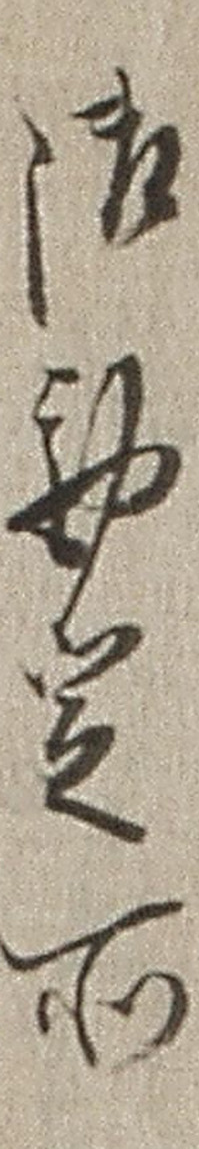御勘定所
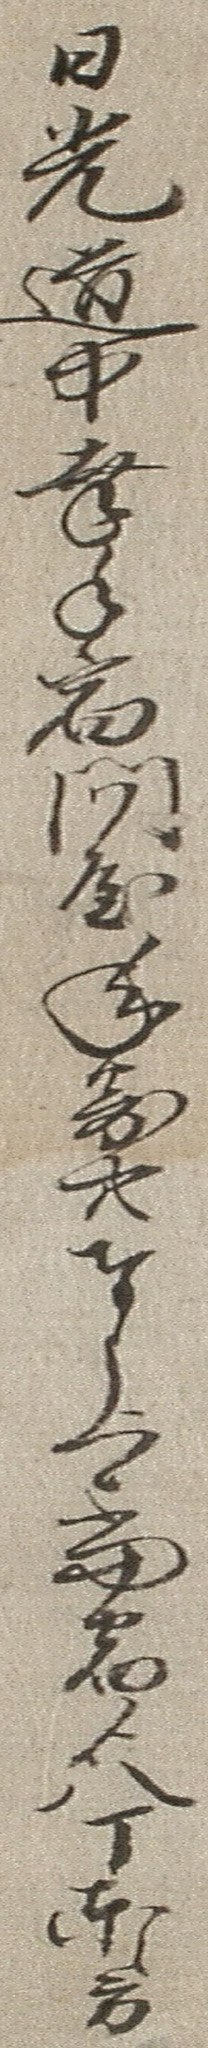日光道中幸手宿問屋年寄共奉申上候当宿ゟ八丁東之方
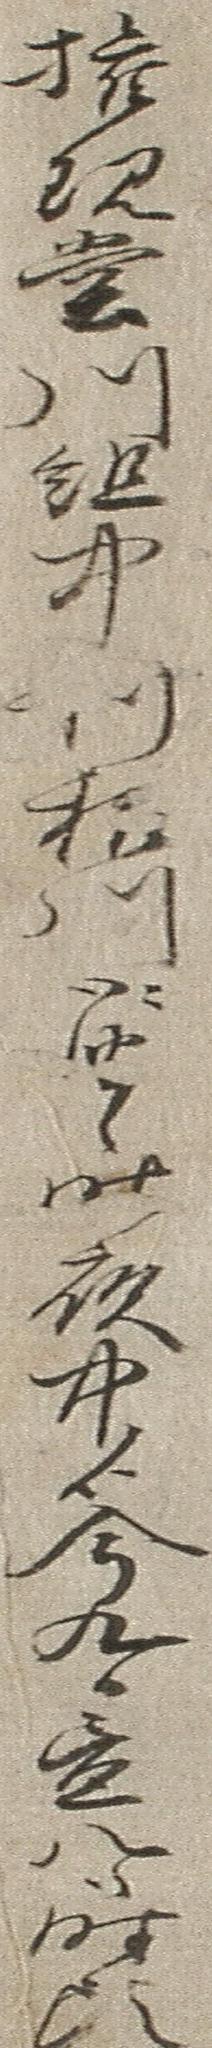権現堂川組中川松川に御座候時夜中ゟ今九日昼八ッ時頃
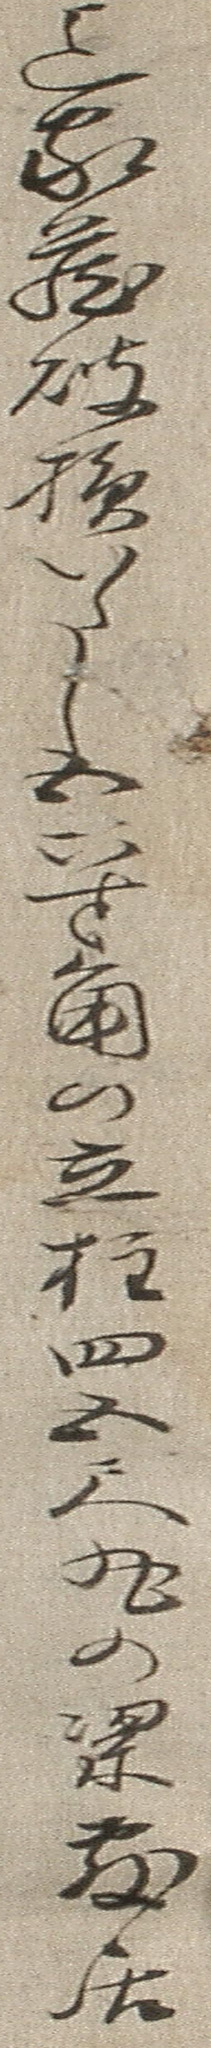迄家蔵破損いたし五六寸角の立柱四五尺丸の梁敷居
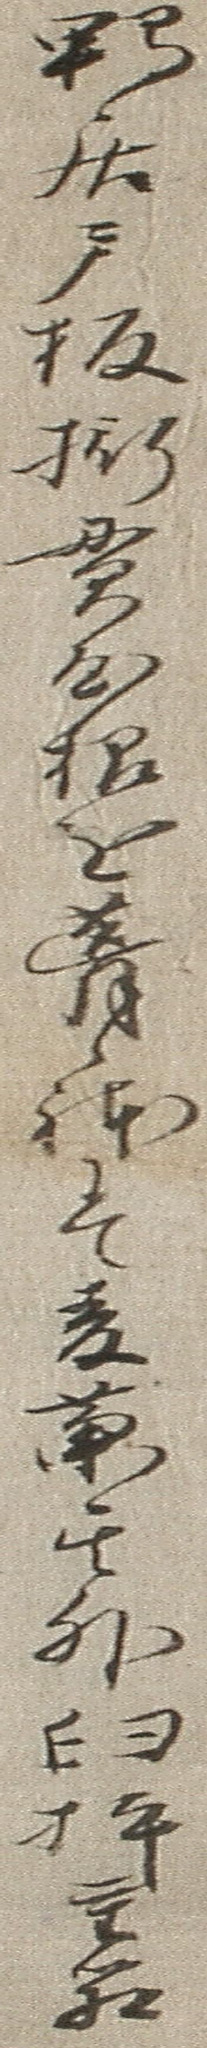鴨居戸板桁貫屋根を葺候体にて麦藁其外𦥑杵重箱
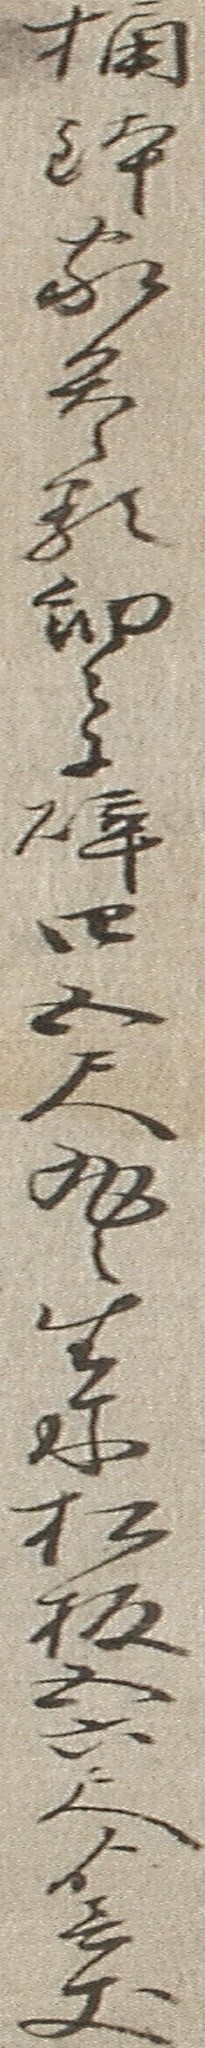桶鉢家具之類細々に砕四五尺丸之生木松板五六尺ゟ壱丈
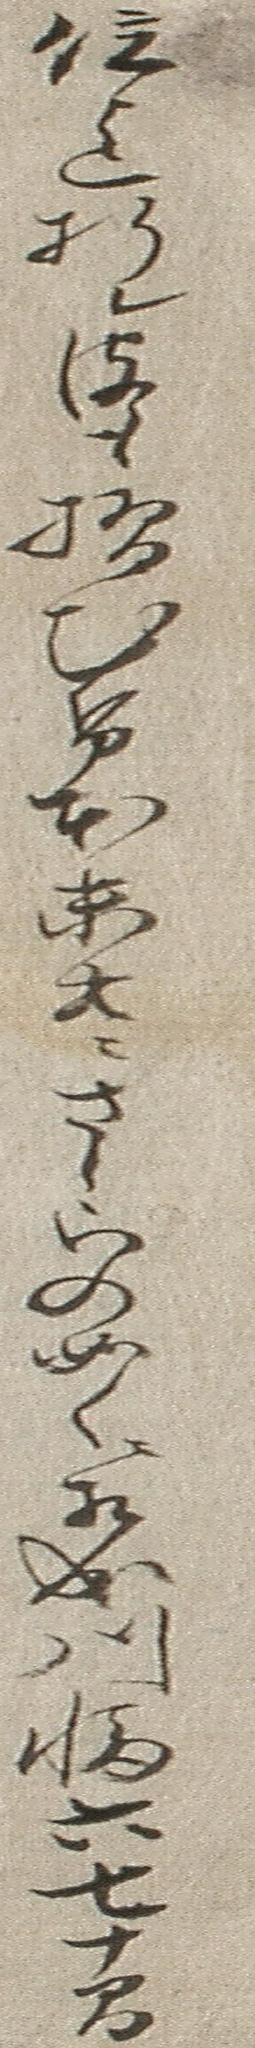位迄折れ皮も摺むけ本末共にさゝらの如くに相成川幅六七十間
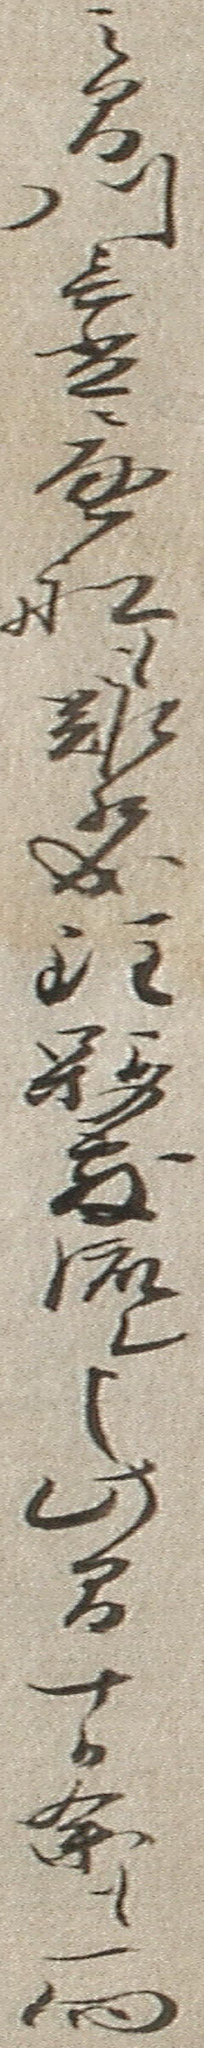之間川壱盃に通船も難相成程夥敷流れ申候此間十日余も一向
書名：太平秘録抜書　浅間山燒及普賢山崩
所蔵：東京大学地震研究所図書室 Earthquake Research Institute Library, The University of Tokyo, JAPAN
